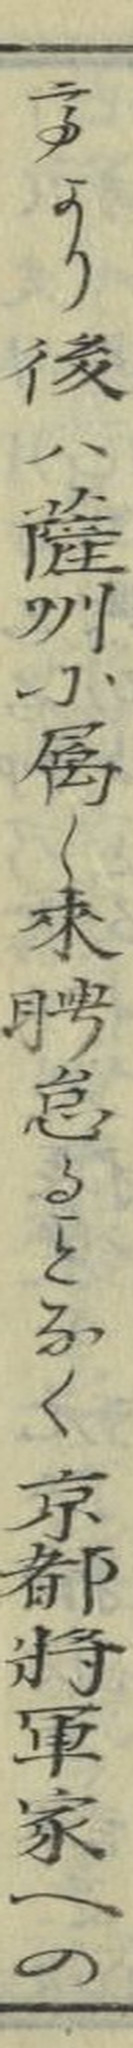てより後は薩州に属し来聘怠ることなく京都将軍家への
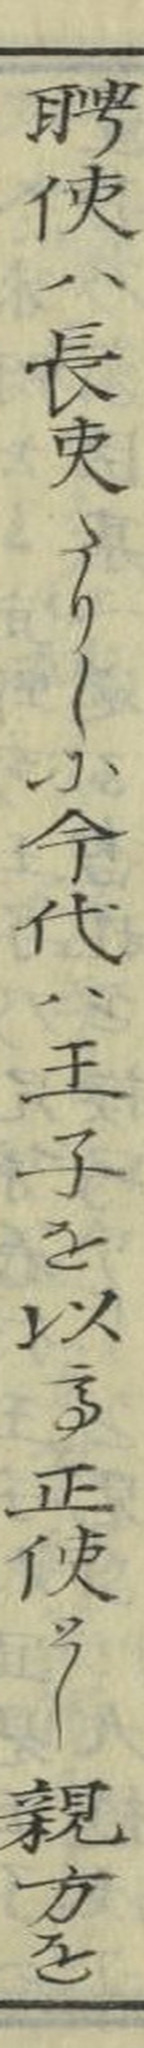聘使は長吏たりしに今代は王子を以て正使とし親方を
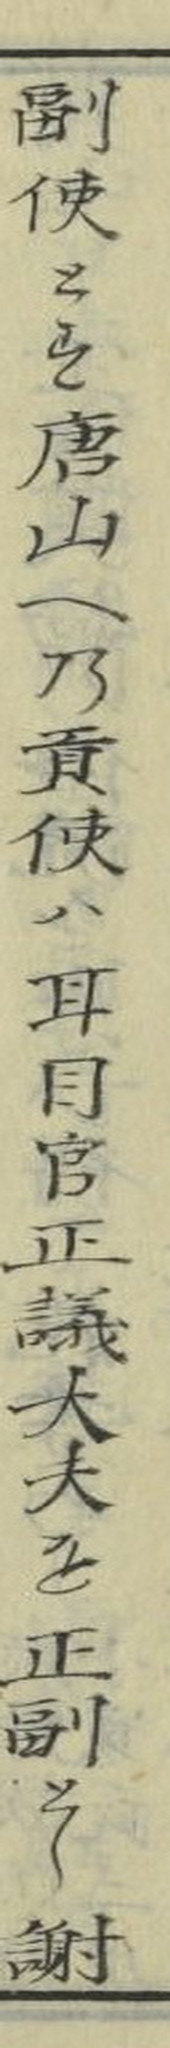副使とす唐山への貢使は耳目官正議大夫を正副とし謝
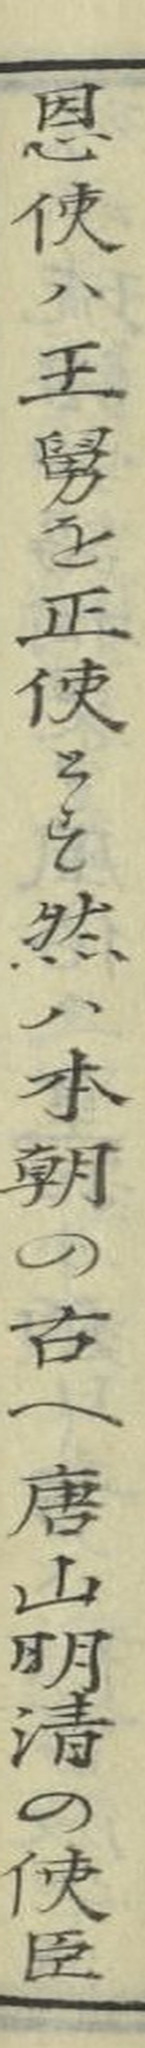恩使は王舅を正使とす然は本朝の古へ唐山明清の使臣
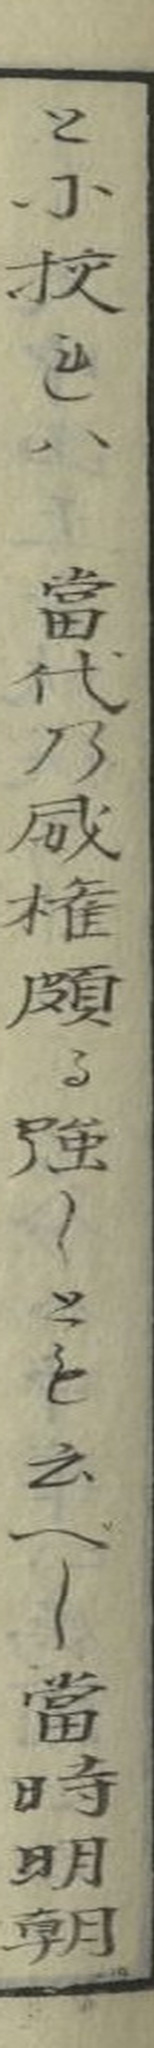とに挍れは当代の威権頗る強しとも云べし当時明朝
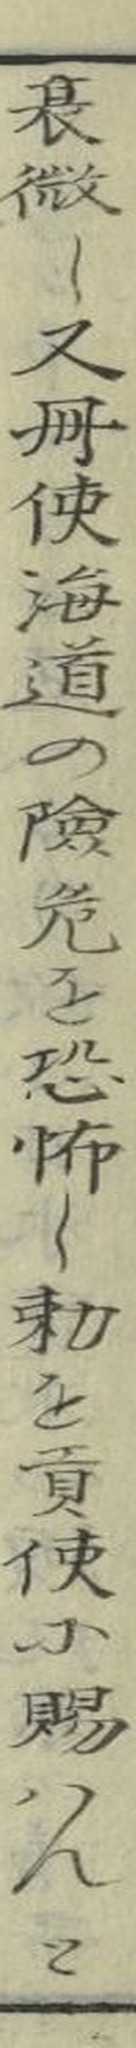衰微し又冊使海道の険危を恐怖し勅を貢使に賜はんと
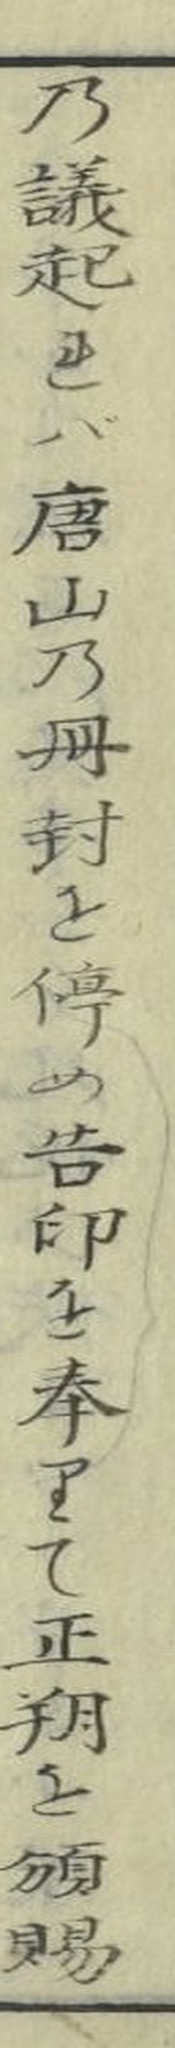の議起れば唐山の冊封を停め告印を奉りて正朔を頒賜
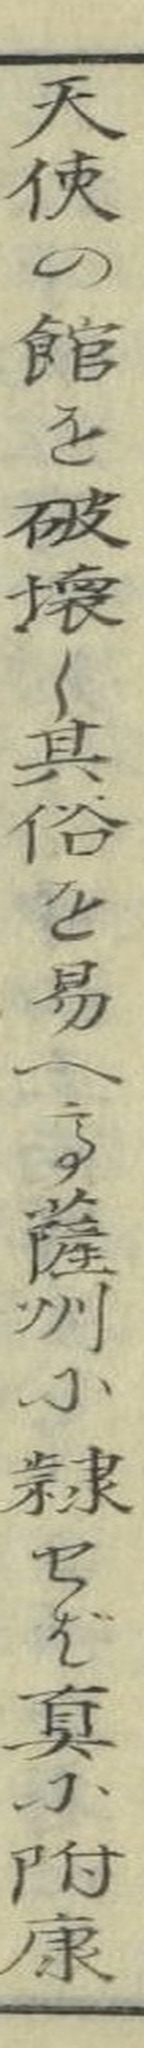天使の館を破壊し其俗を易へて薩州に隷せば真に附康
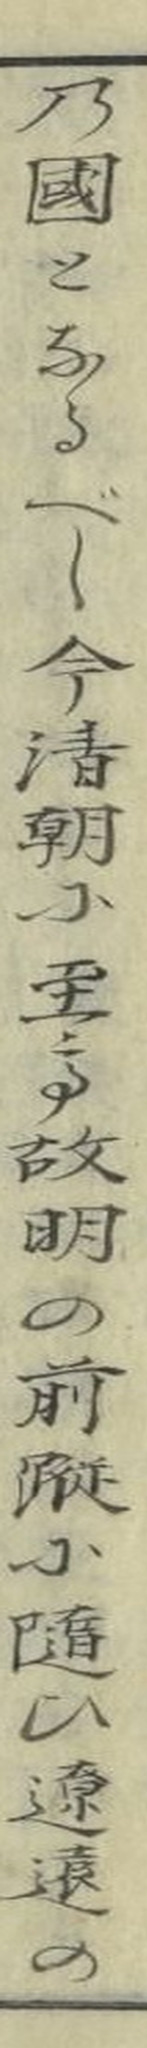の国となるべし今清朝に至て故明の前蹤に随ひ遼遠の
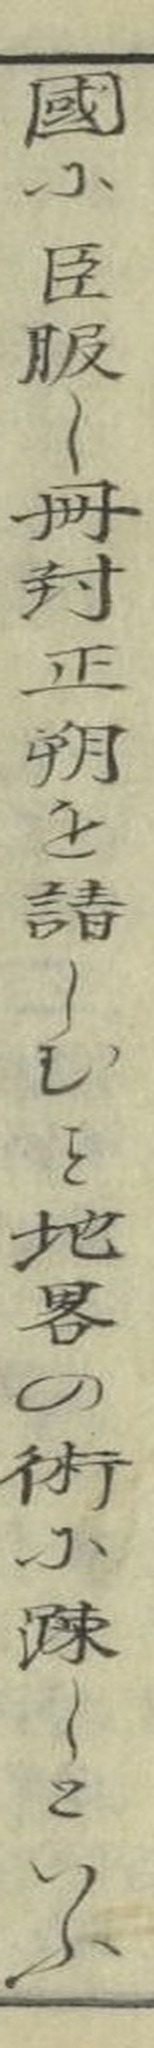国に臣服し冊封正朔を請しむこと地略の術に疎しといふ
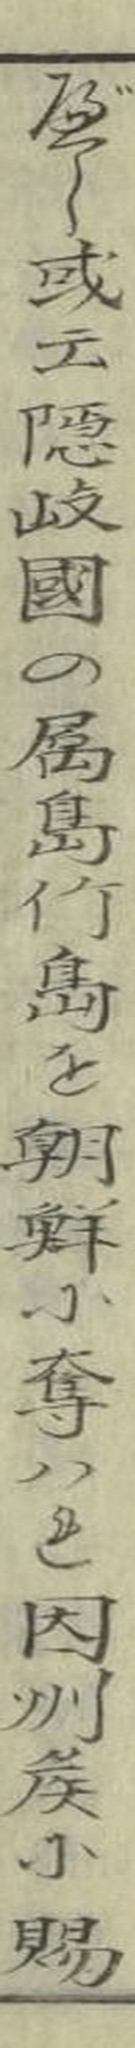べし或云隠岐国の属島竹島を朝鮮に奪はれ因州侯に賜
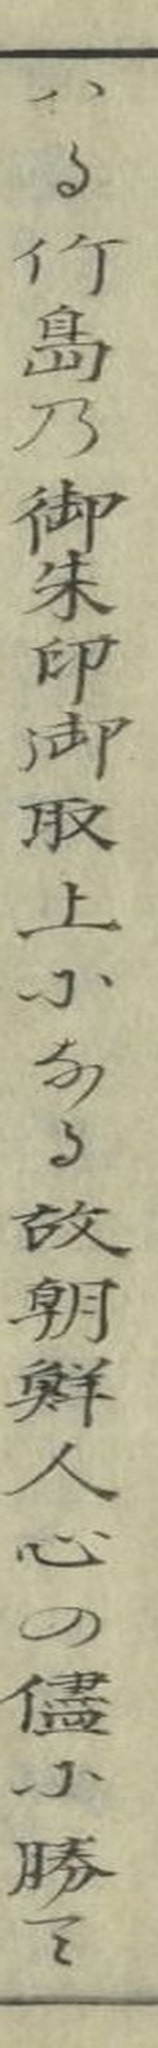はる竹島の御朱印御取上になる故朝鮮人心の儘に勝て
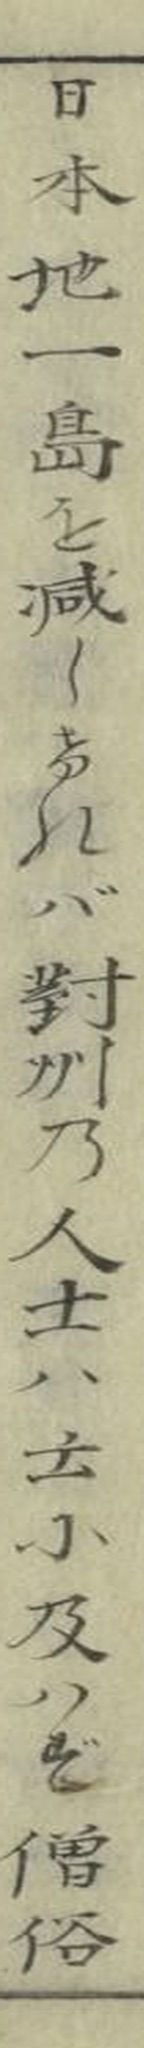日本地一島を減しければ対州の人士は云に及はず僧俗
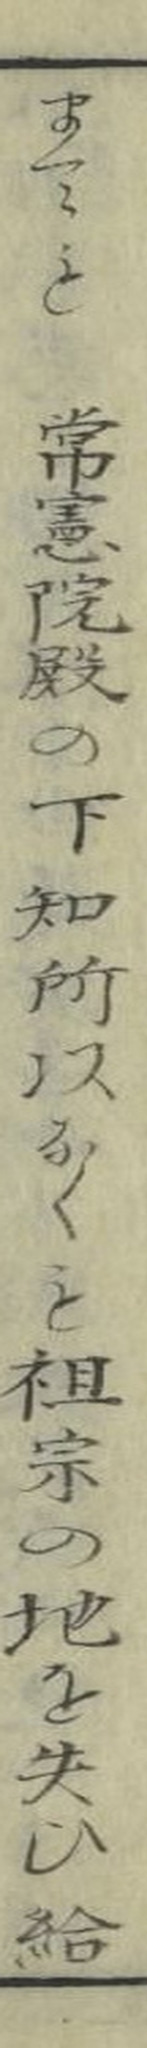まても常憲院殿の下知所以なくも祖宗の地を失ひ給

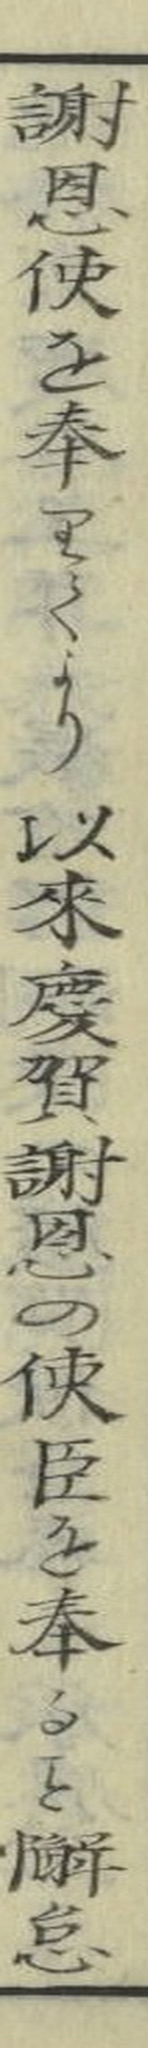謝恩使を奉りてより以来慶賀謝恩の使臣を奉ること懈怠
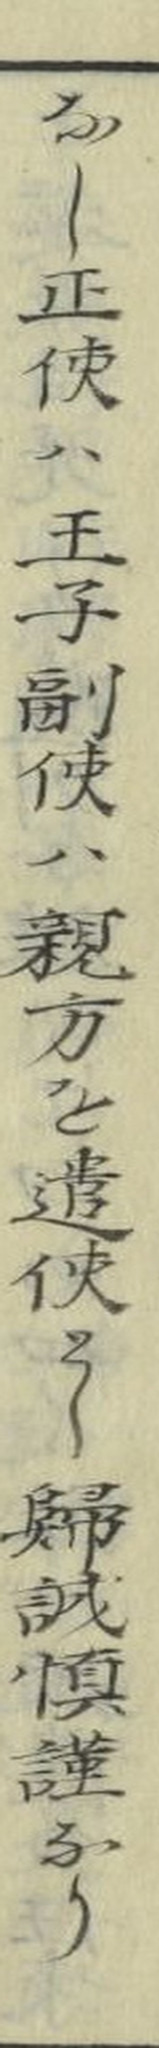なし正使は王子副使は親方を遣使とし帰誠慎謹なり
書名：琉球沿革志 下
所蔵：University of the Ryukyus Library
